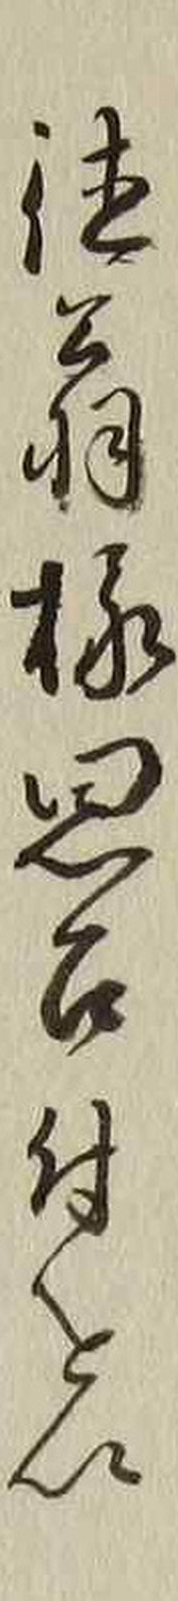徳翁様思召を以
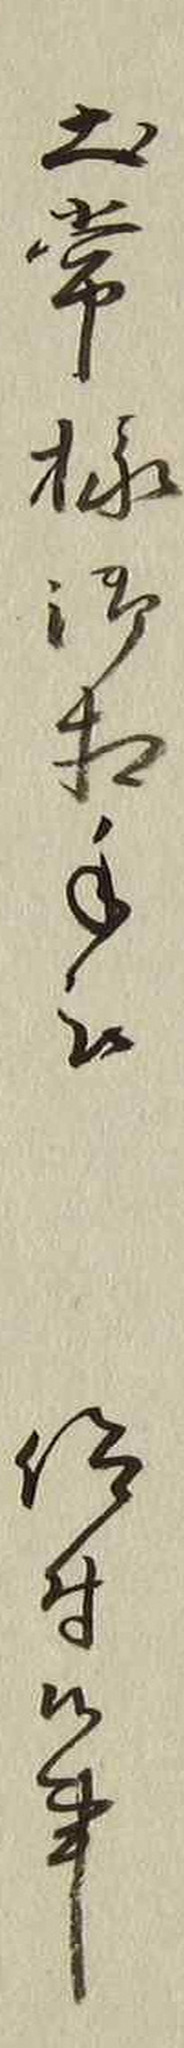土常様御相手被仰付候事
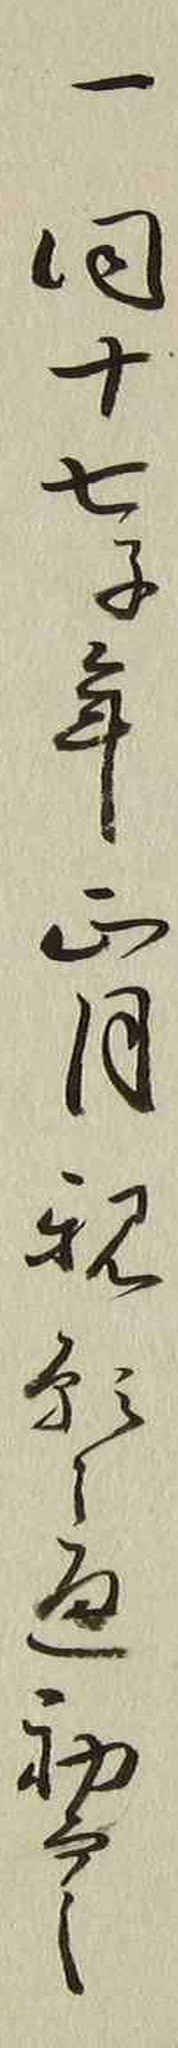一同十七子年正月親願之通初而之
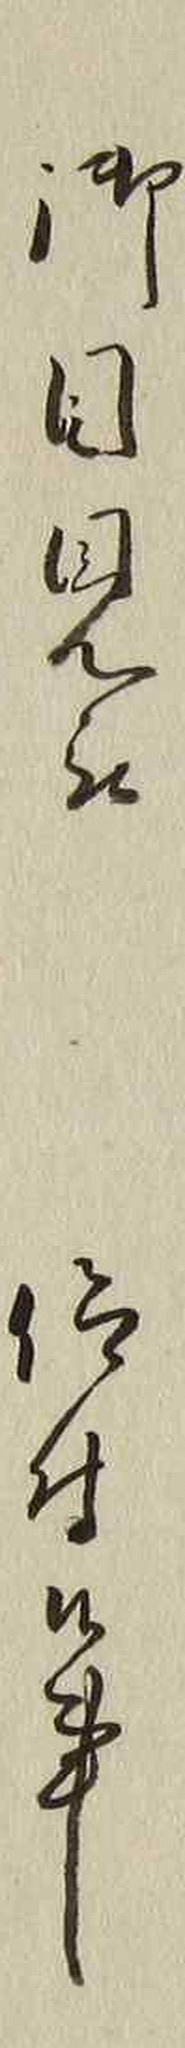御目見被仰付候事
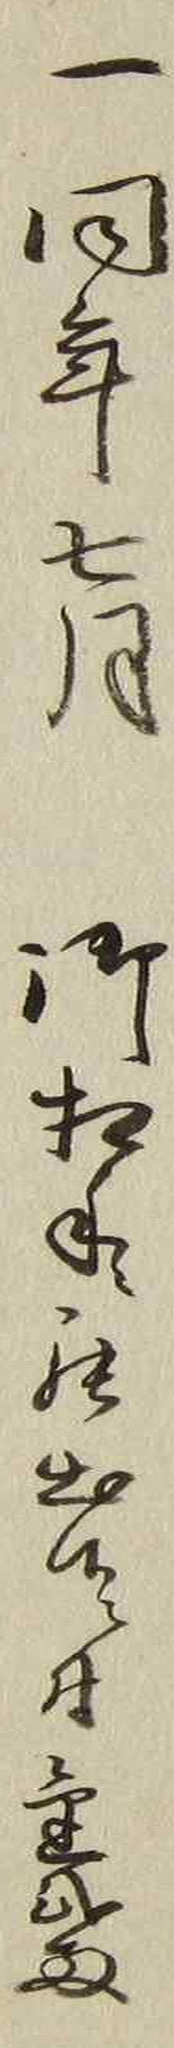一同年七月御相手ニ罷出候ニ付金弐両
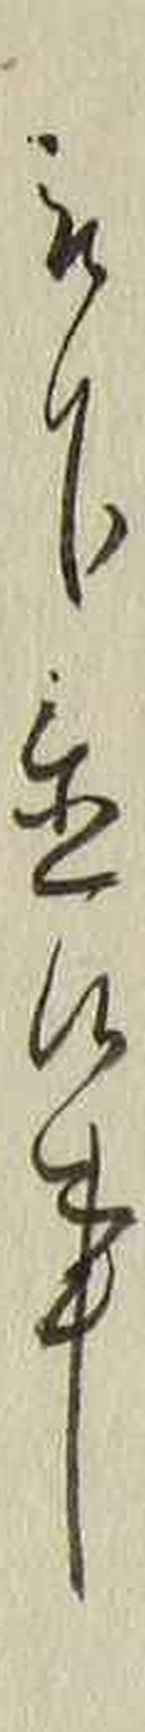被下置候事
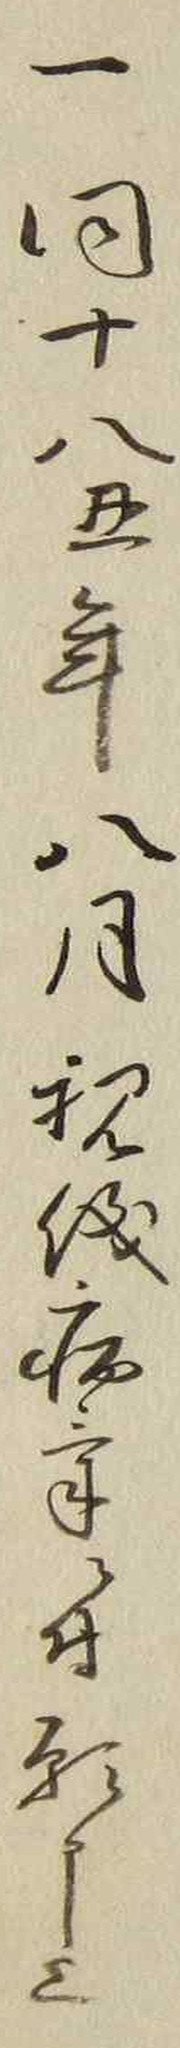一同十八丑年八月親儀病気ニ付願申上

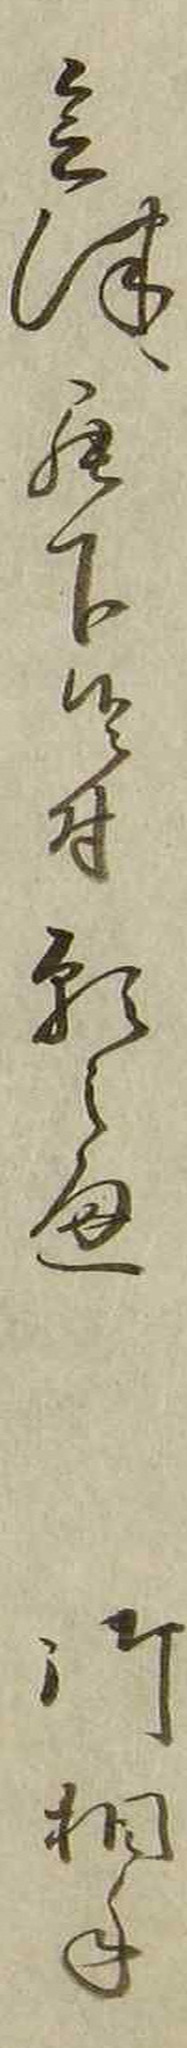会津へ罷下候ニ付願之通御相手
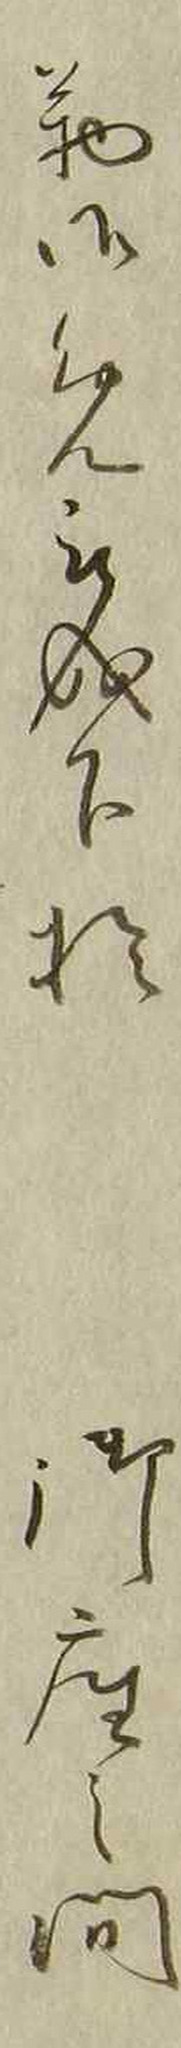勤御免被成下於御座之間
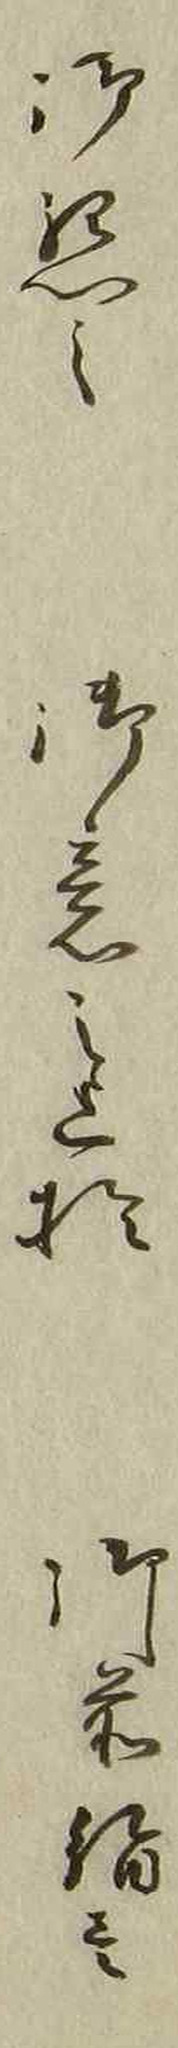御懇之御意之上於御前絹壱
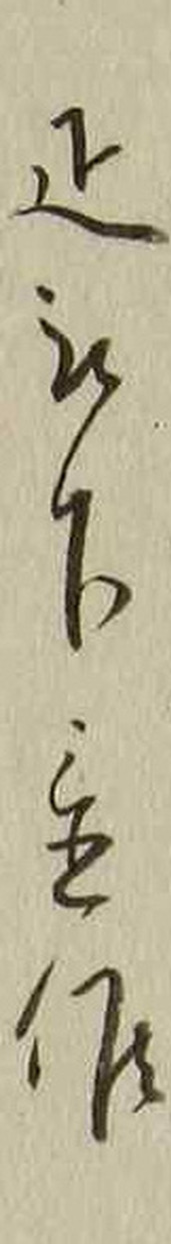疋被下置候
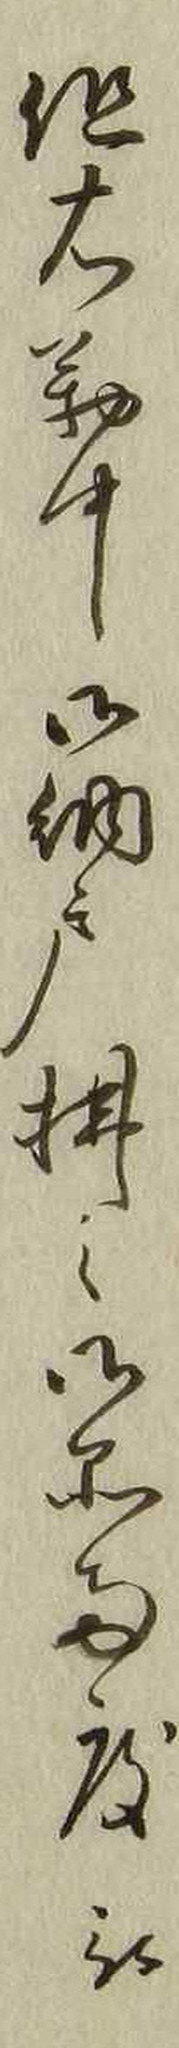但右勤中御納戸払之御品両度被
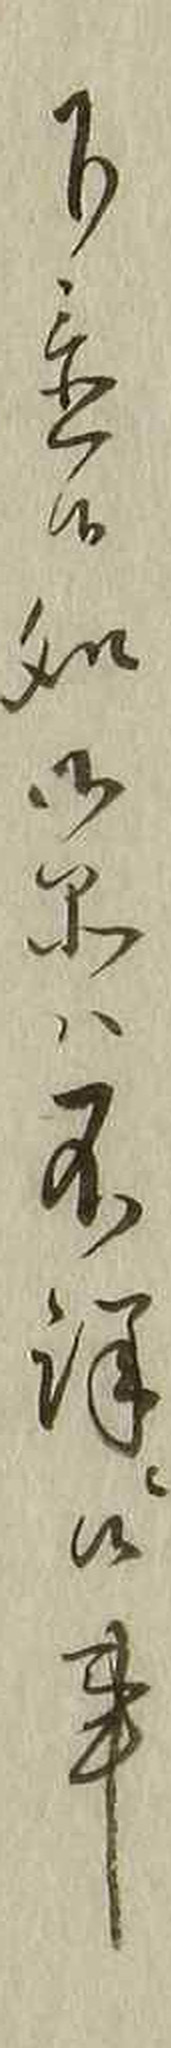下置候処御品ハ不詳ニ候事
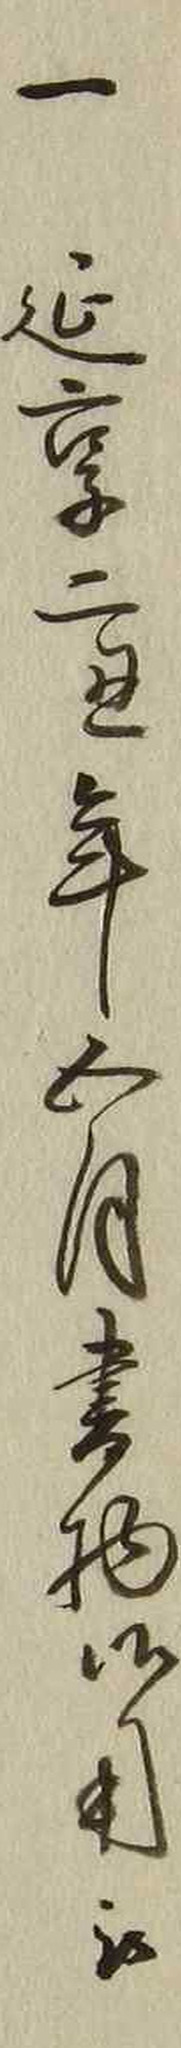一延享二丑年五月書物御用被
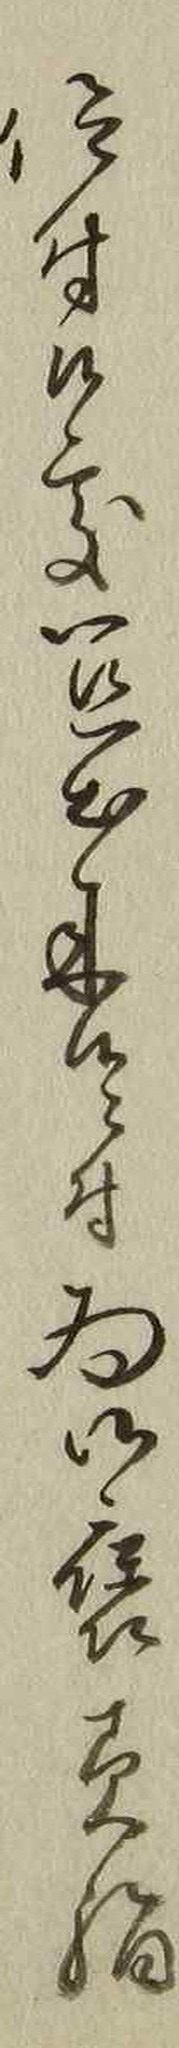仰付候処宜出来候ニ付為御褒美絹
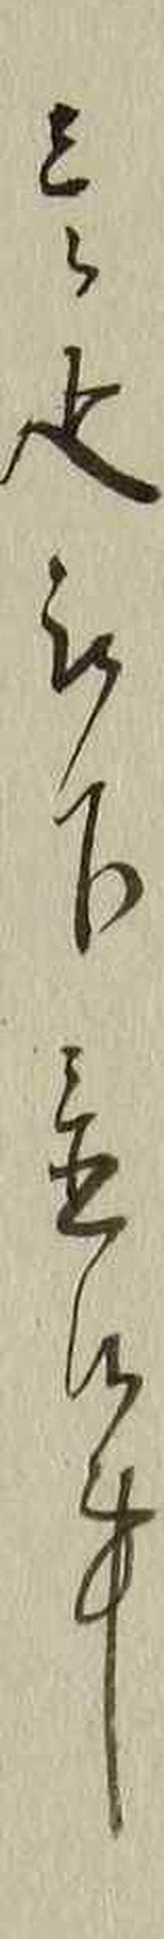壱疋被下置候事
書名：諸士系譜　巻之4　い之部4
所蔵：会津若松市立会津図書館
